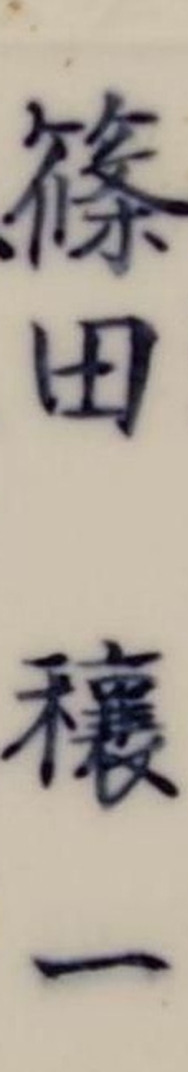篠田禳一
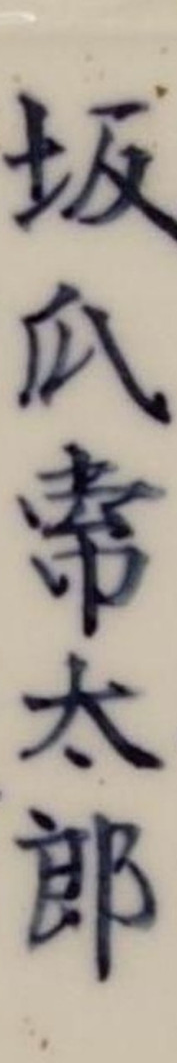坂瓜帝太郎
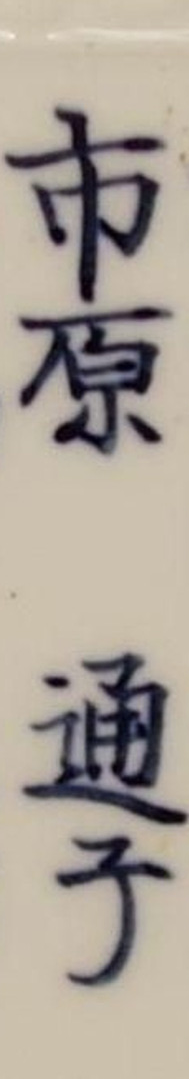市原通子
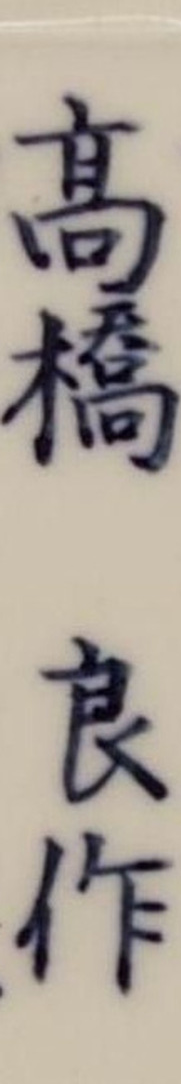高橋良作
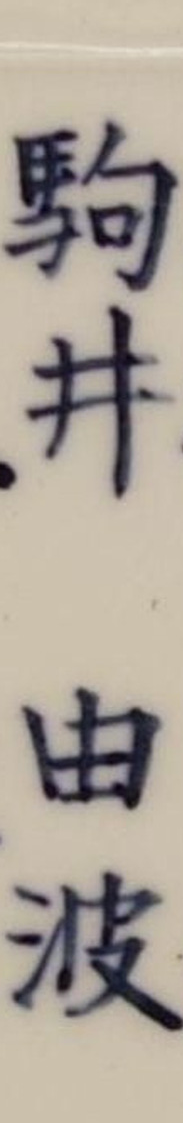駒井由波
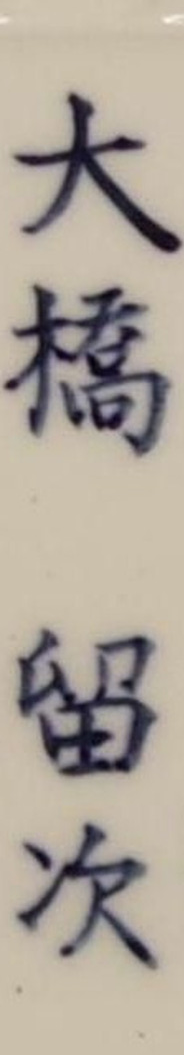大橋留次
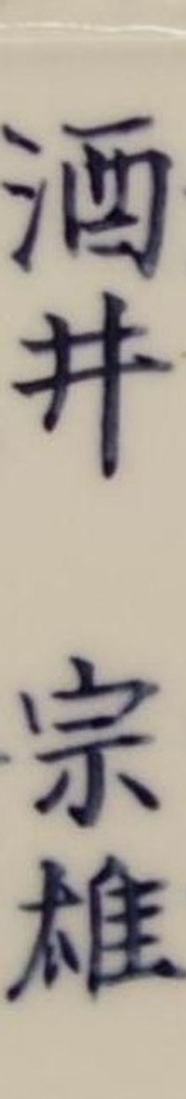酒井宗雄
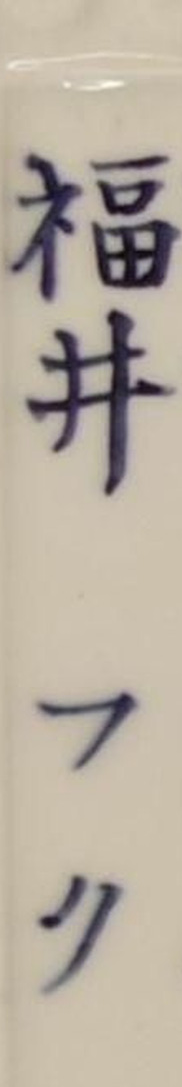福井フク

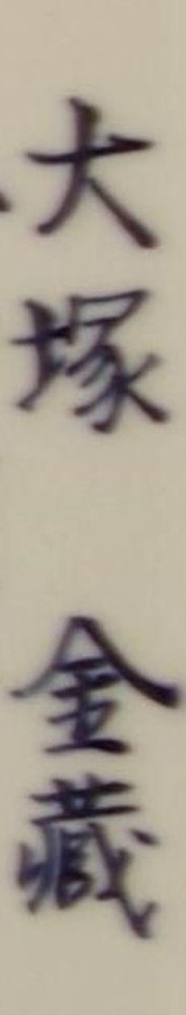大塚金蔵
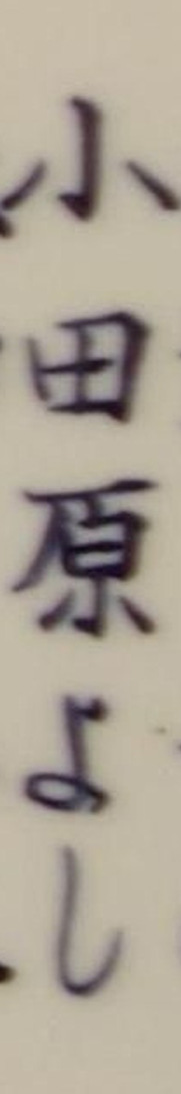小田原よし
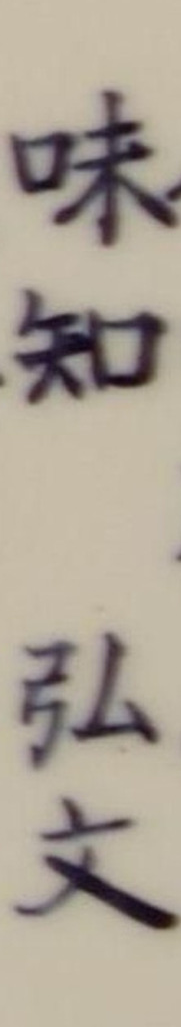味知弘文
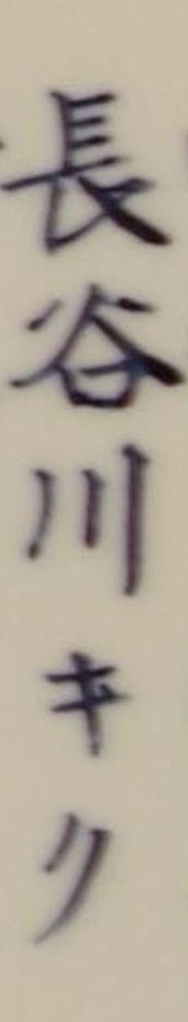長谷川キク
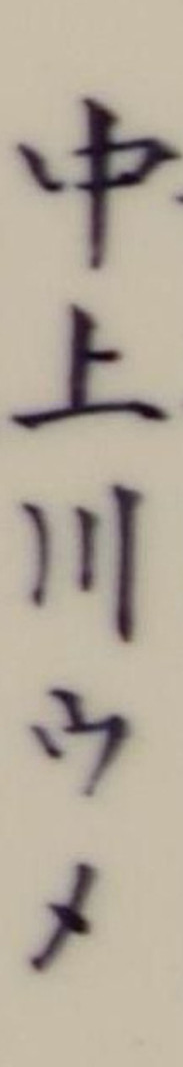中上川ウメ
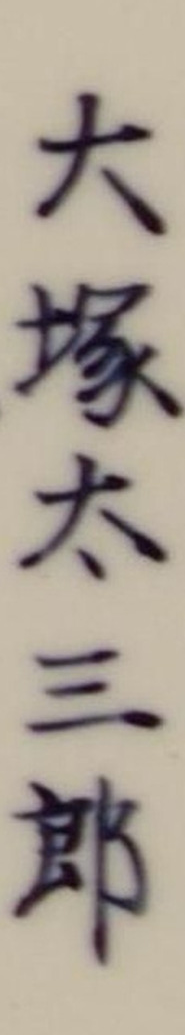大塚太三郎
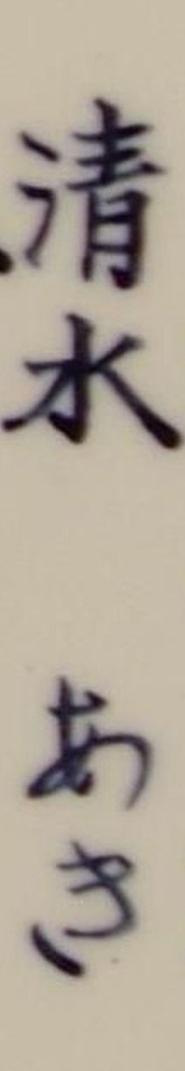清水あき
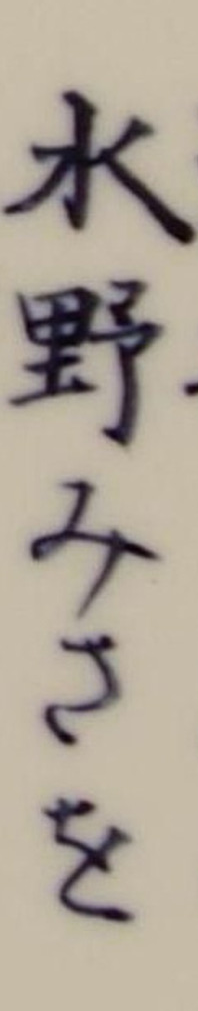水野みさを
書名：E~L
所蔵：高野山金剛峯寺
